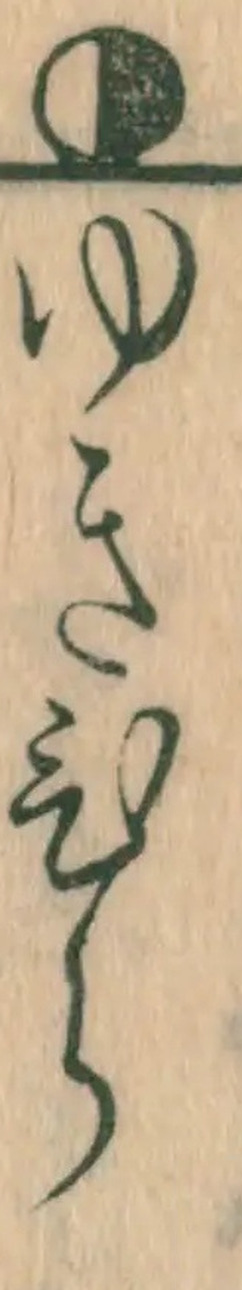ゆきひら
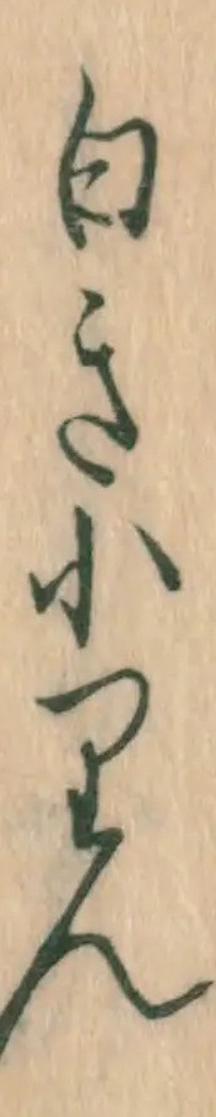白き小りん
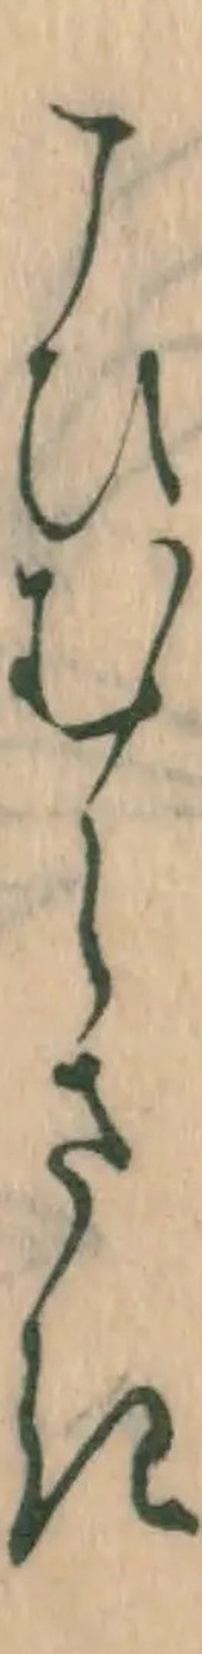こひむらさき
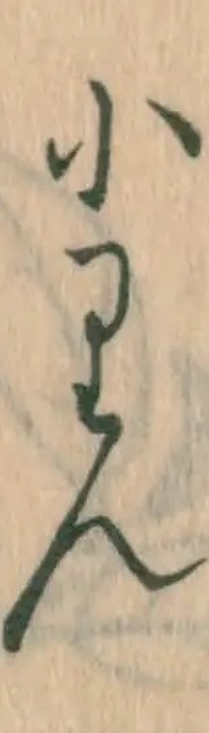小りん
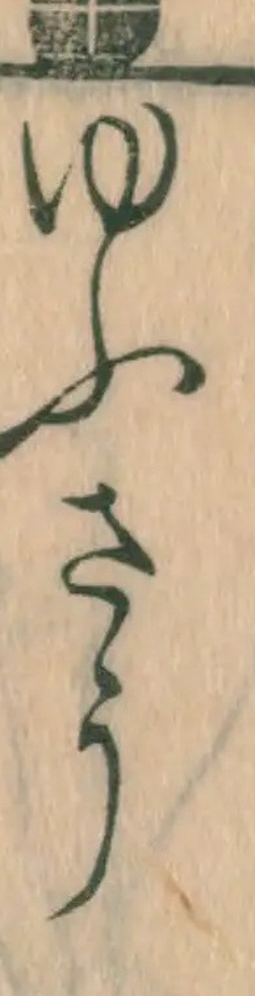ゆふさう
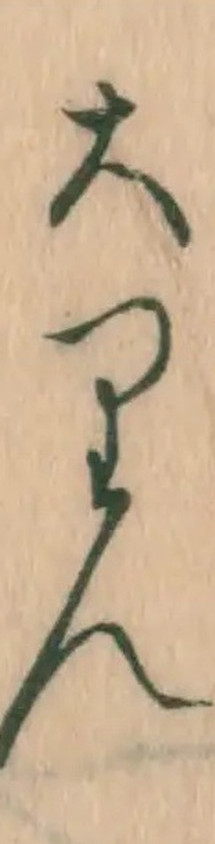大りん
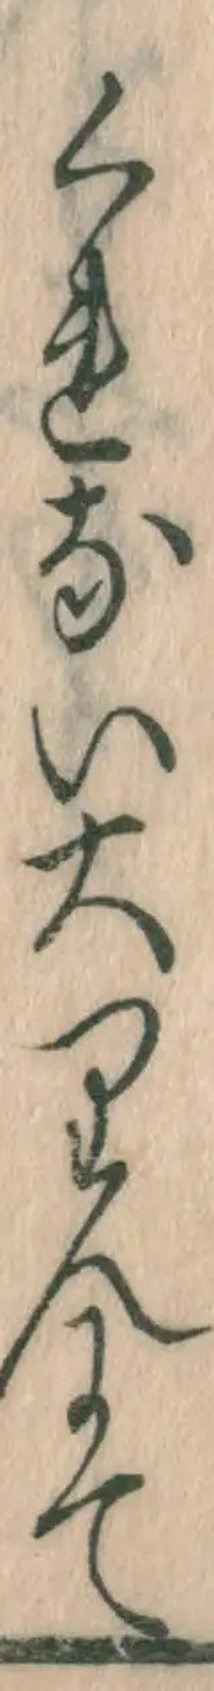くれない大りんにて
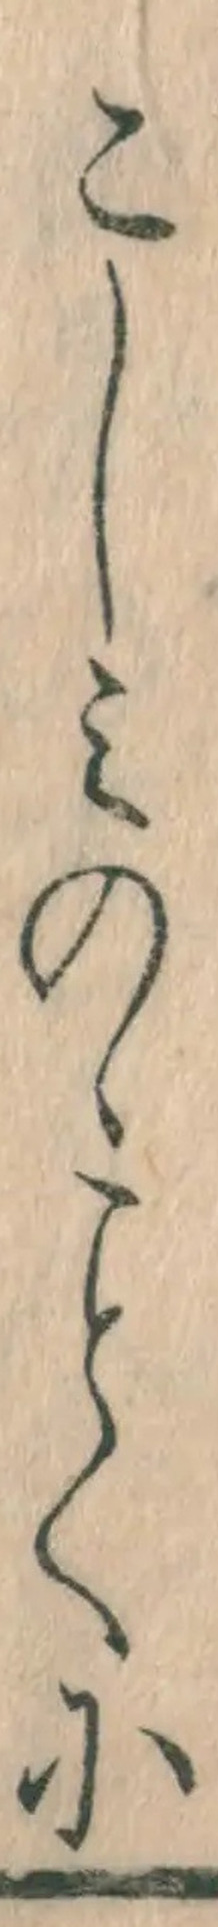こしみののことくに
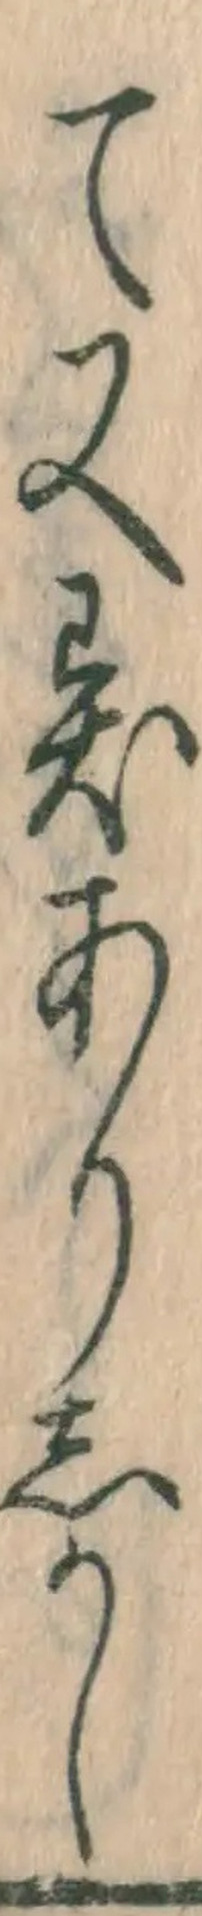て又異ありしかし

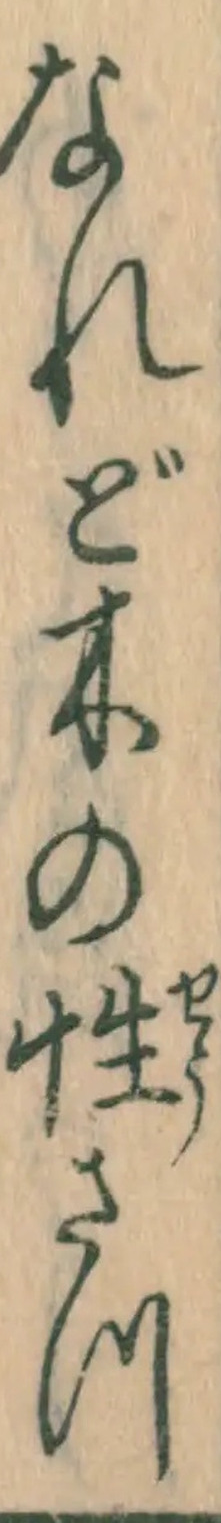なれど木の性さつ
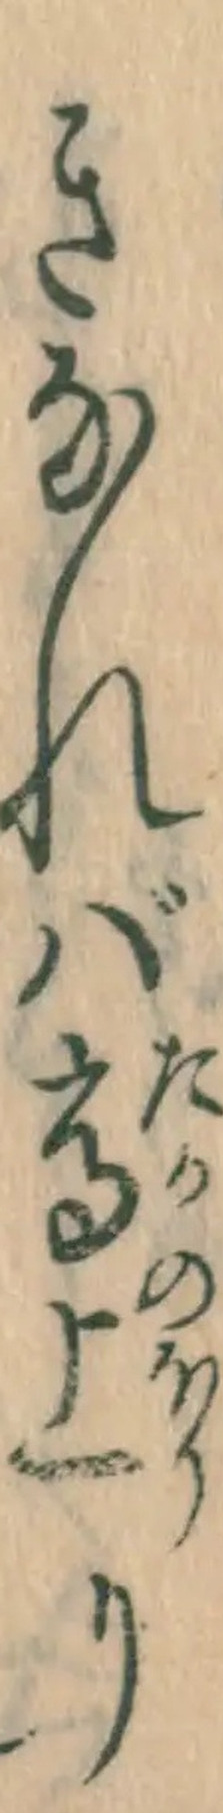きなれば高上り
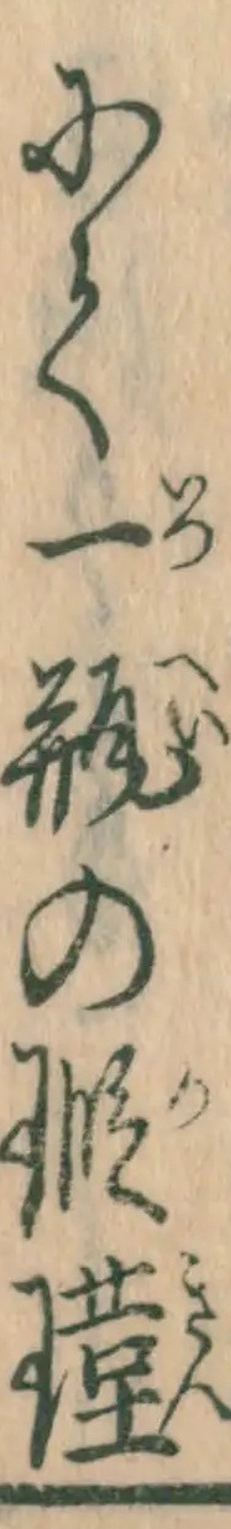にて一瓶の瑕瑾
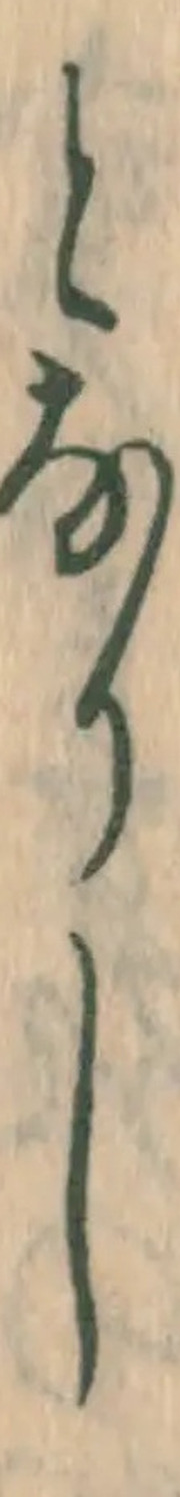となりし
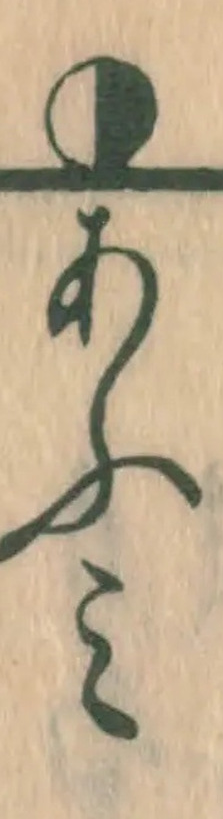あふみ
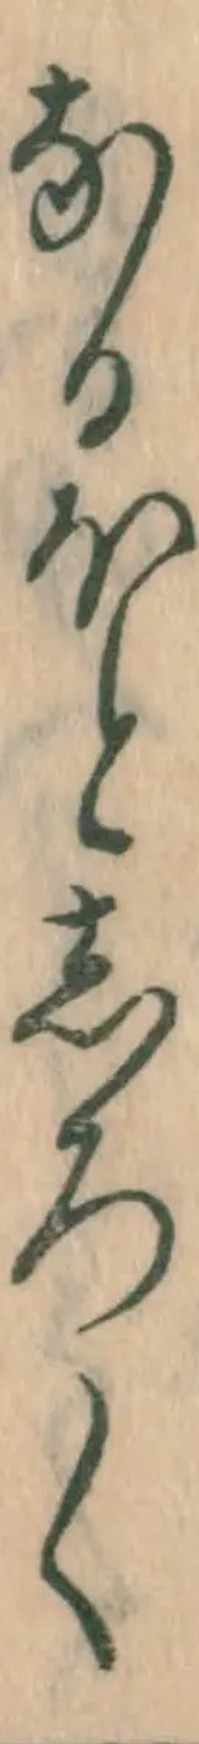なるほとしろく
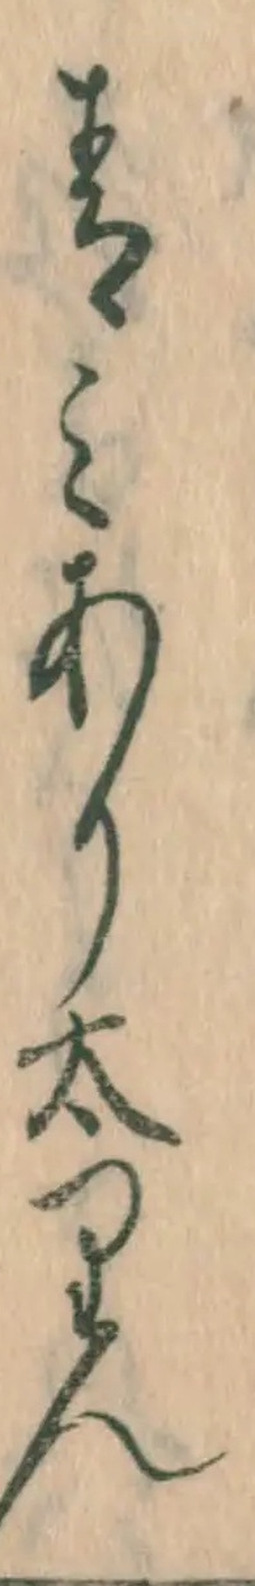青みあり太りん
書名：錦繍枕 5巻. [4]
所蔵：国立国会図書館 National Diet Library, JAPAN
